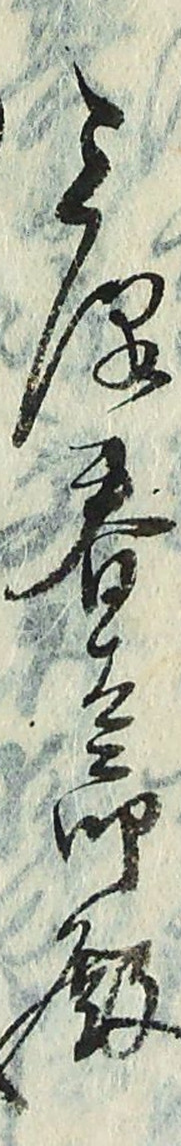三沢春太郎殿
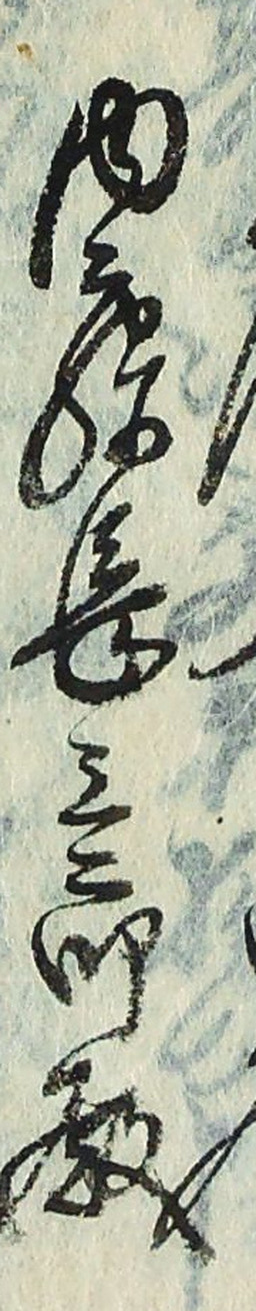内藤長三郎殿
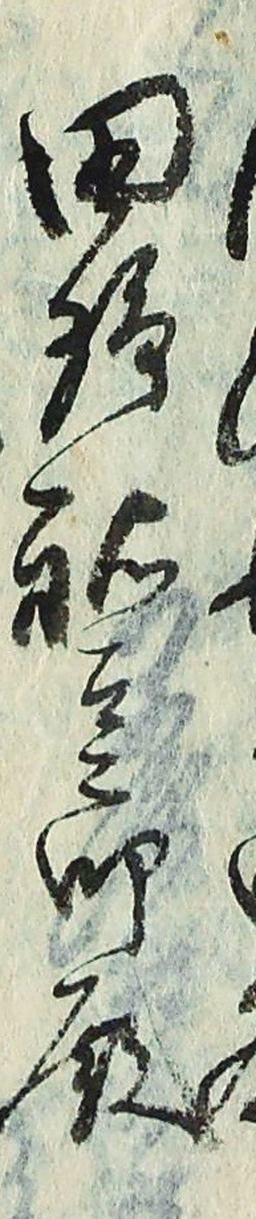田野祐太郎殿
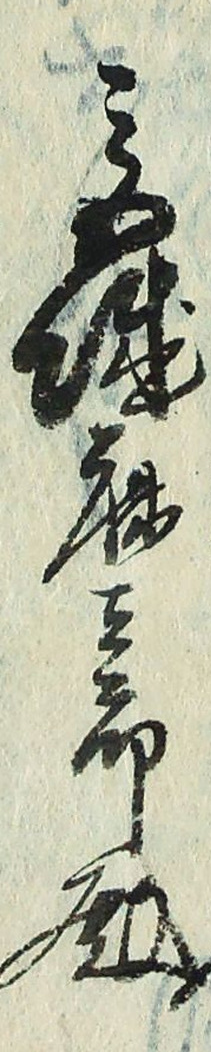宮城麻太郎殿
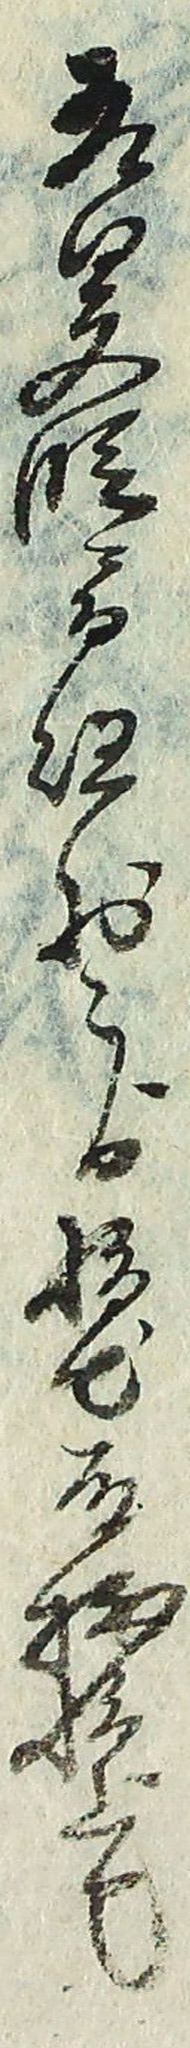右同文段に而組村々ゟ指出取揃指上申候
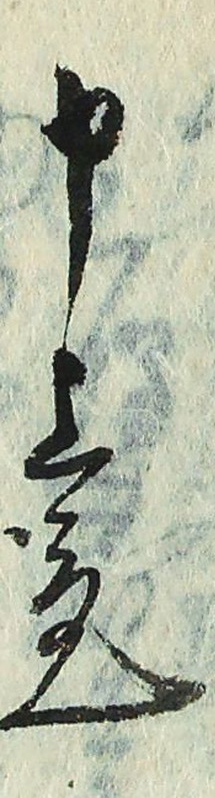申上覚
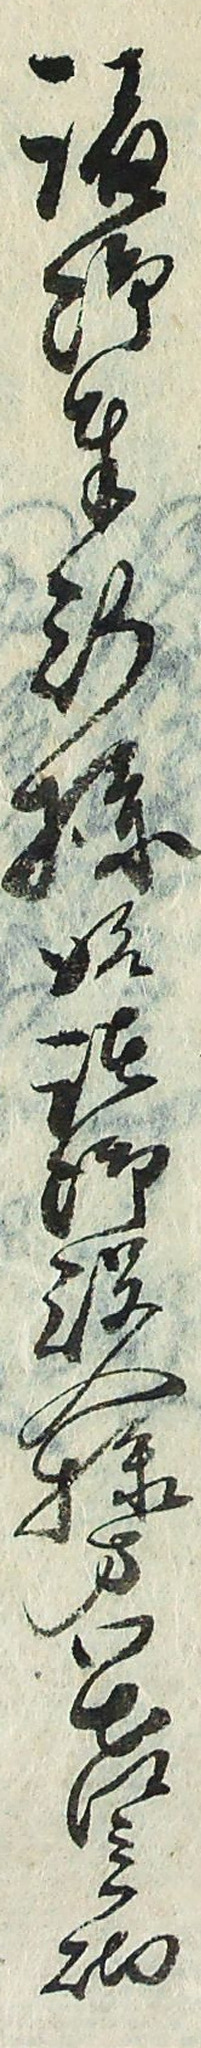諸御奉行様始諸御役人様方御出郷之砌
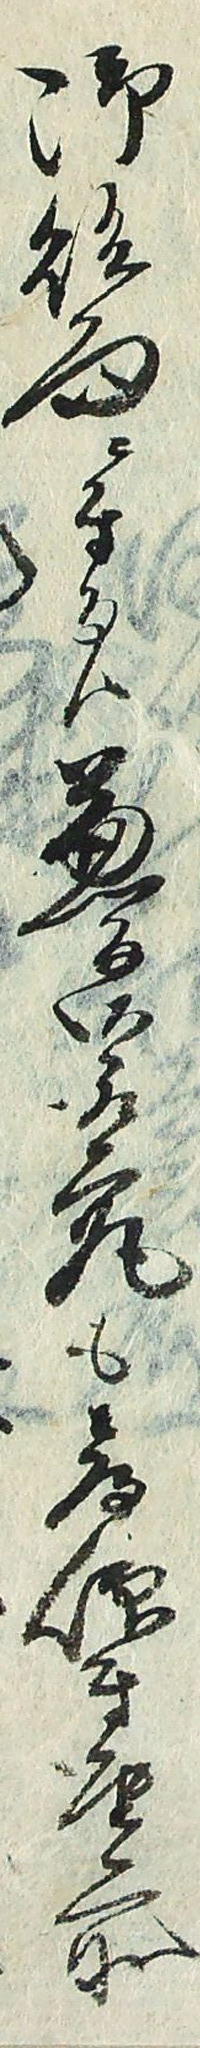御賄向に付而は兼而御取究も被為仰付御坐候所
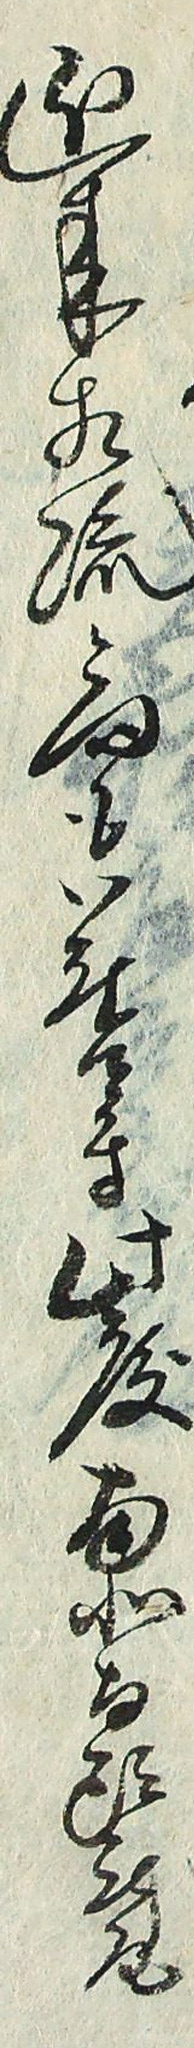近来相流候向も御座候に付此度南北与頭庄屋

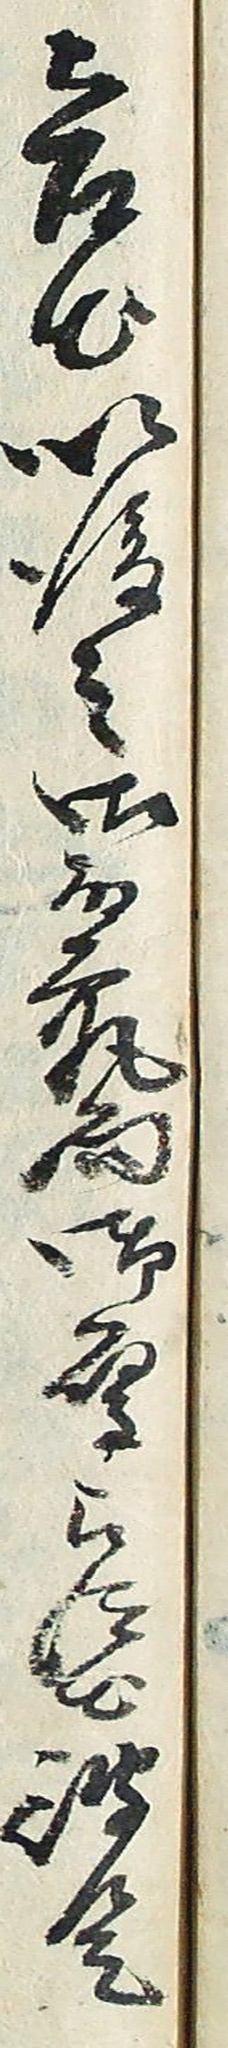被召出以後之御取究向御厚被仰出彼是
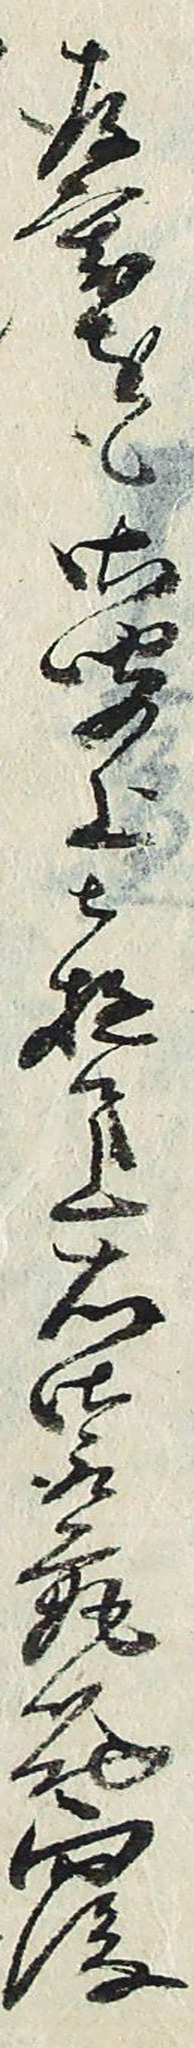存寄をも御聞上被遊候上右御取究筋向後
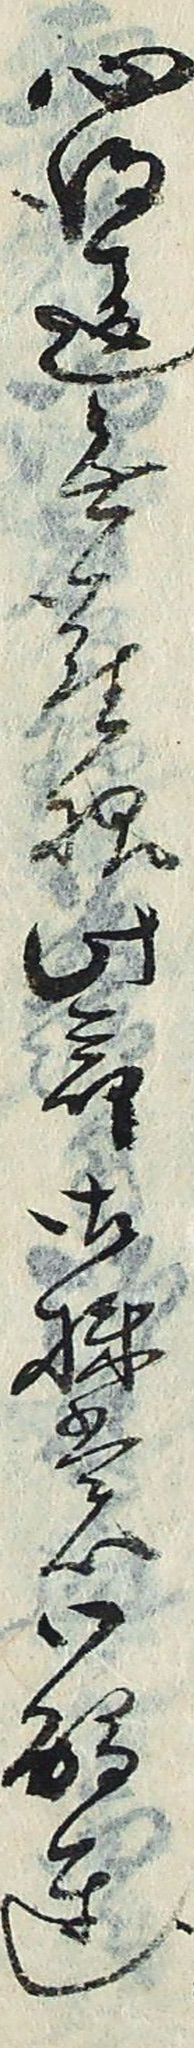心得違無御坐様此節御株書を以御触達
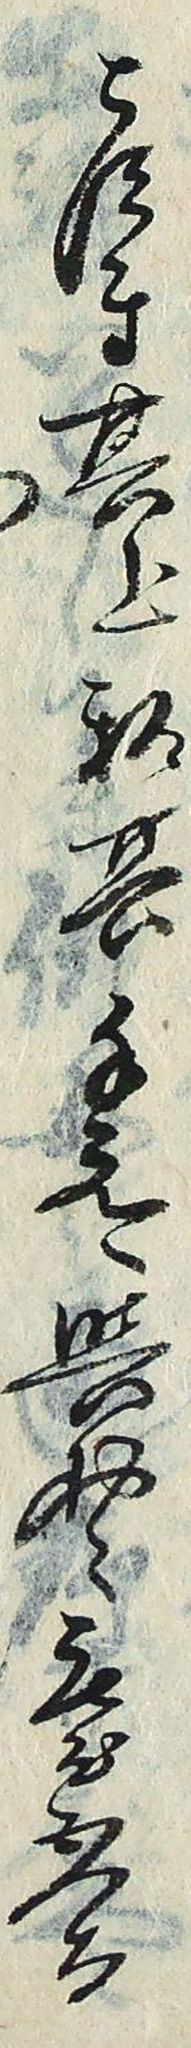被仰付其上私共手元へ与村々庄屋五人与
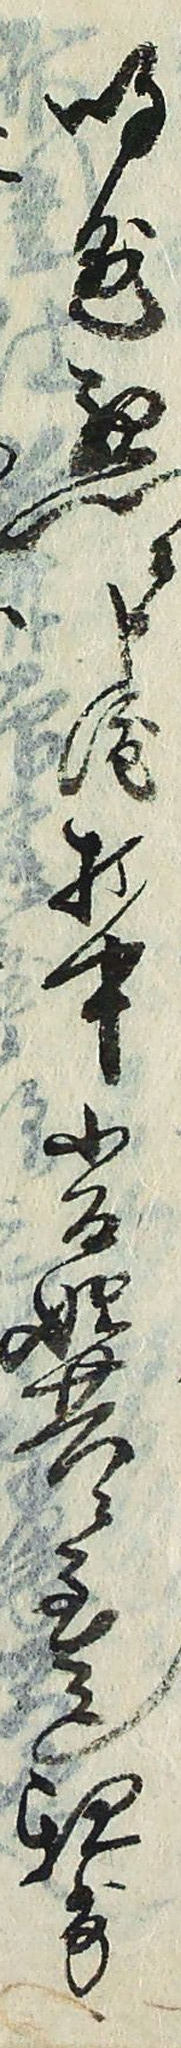呼懸懇に申渡村中小百姓共に至迄親布
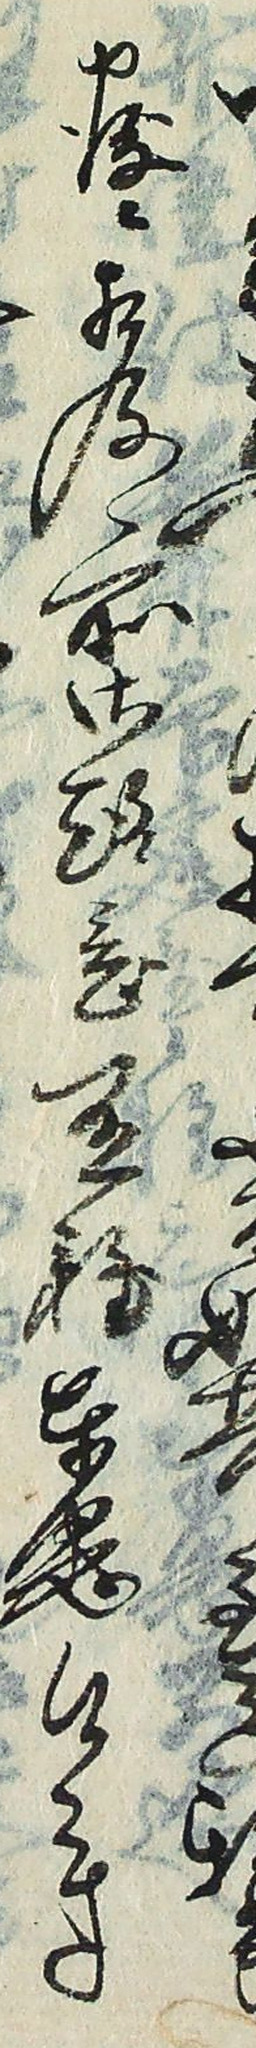申渡に相及候所御趣意有難奉畏候に付
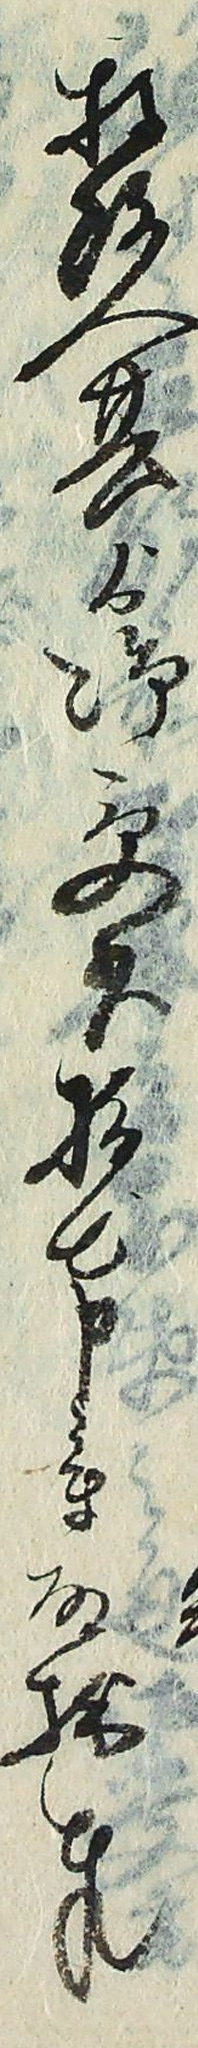村役人共ゟ御受書指出申に付取揃奉
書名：諸御用御□受書控
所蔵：鳴門教育大学 Naruto University of Education
